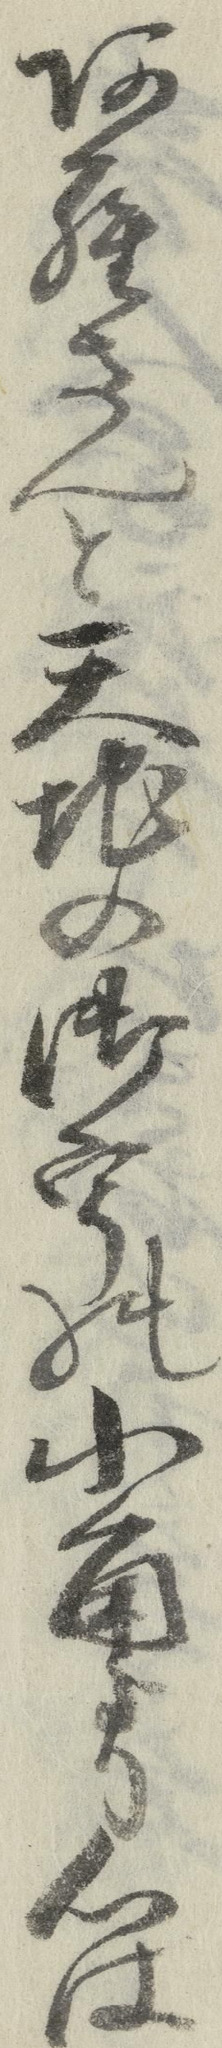あらさんと天地の御宇の小角より心は
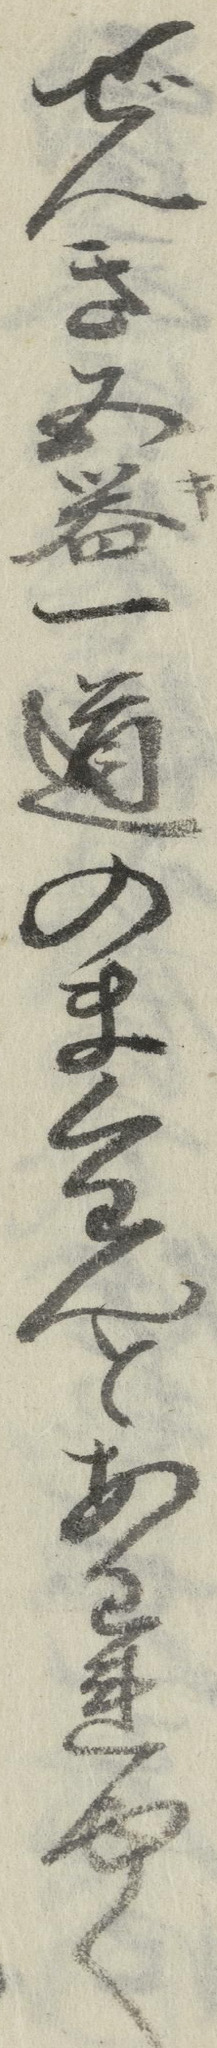ぜんき五器一道のまくわんとあわれゆく
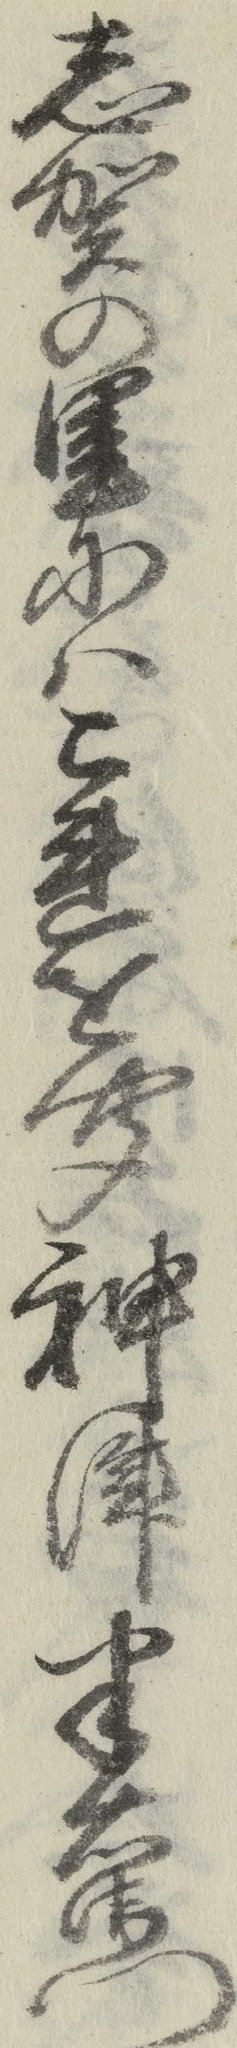志賀の里にはこれを聞神津半右衛門

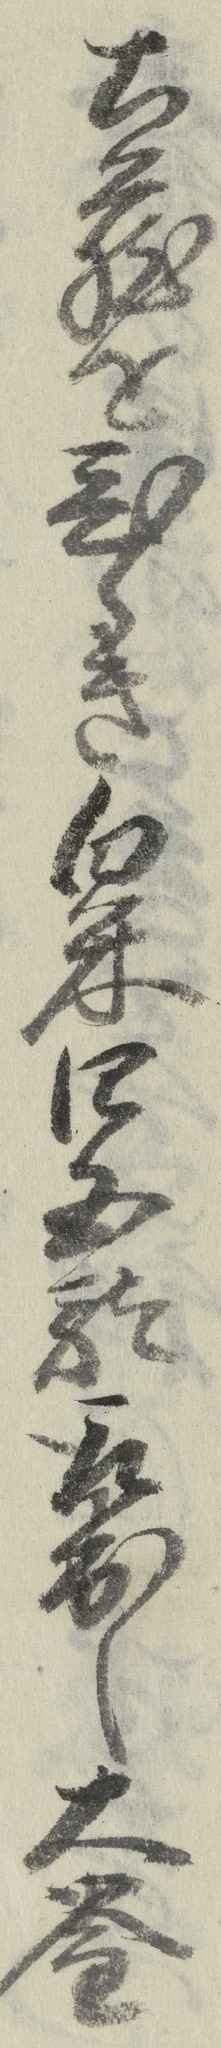土蔵をひらき白米四五駄取出し大釜
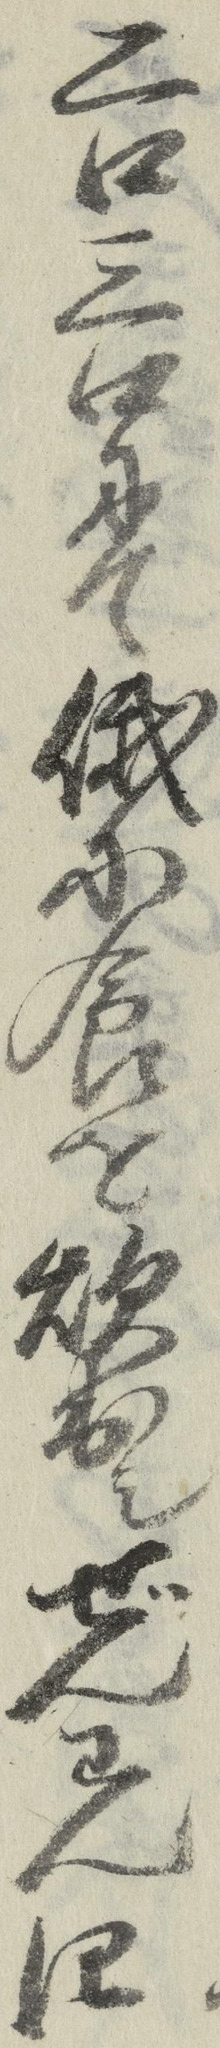二口三口にて俄に食を炊出シぜんわん四
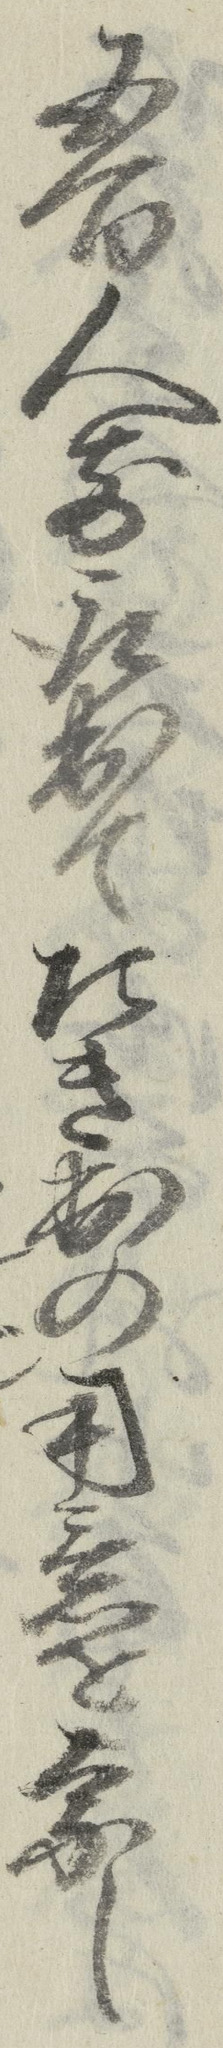五百人前取出てたき出の用意をなし
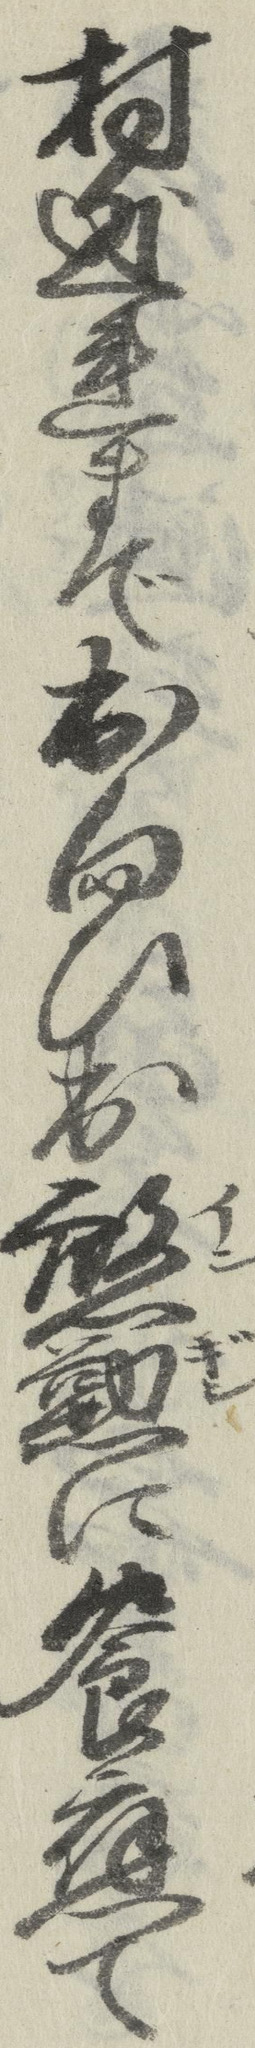村迯れまで出向ひ出慇懃に饗応て
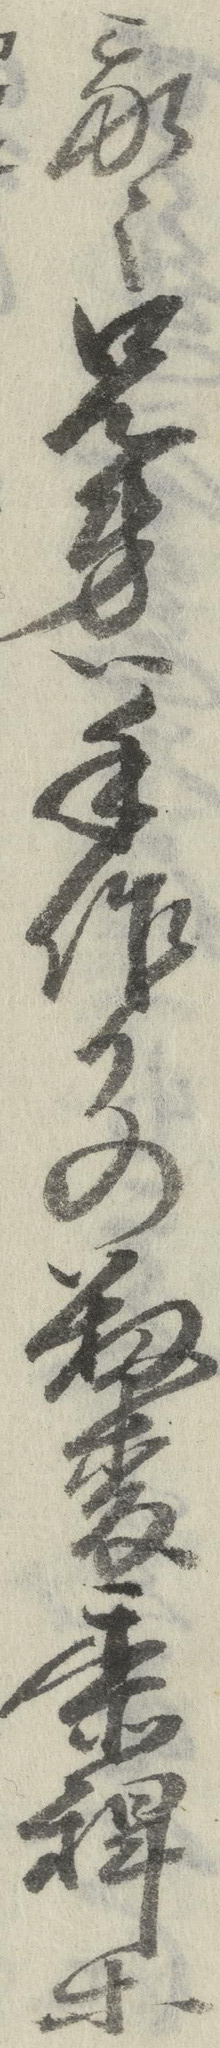我々兄弟は手作りの籾麦粟稗等
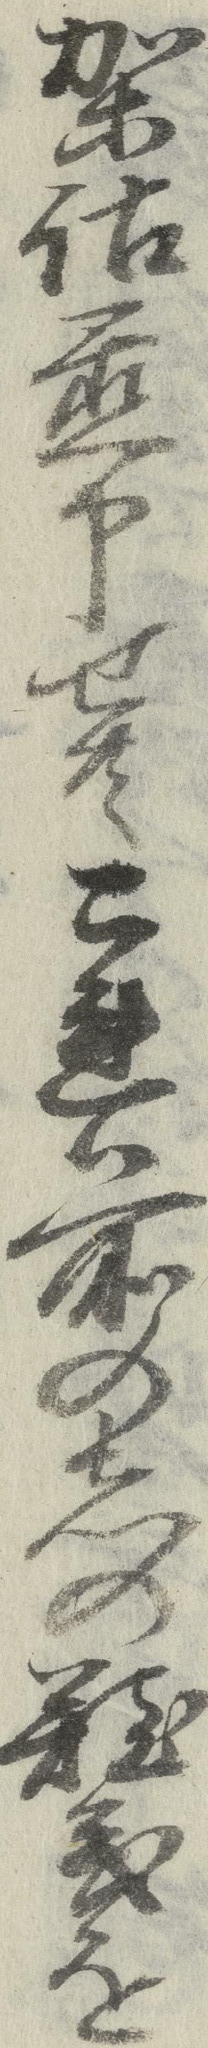架詁置申せ共これは所の者の難義を
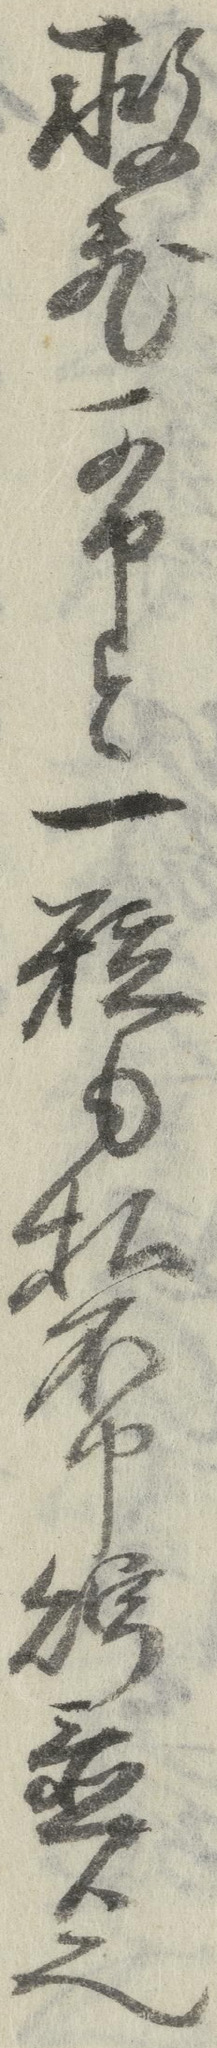救ひ可申と一粒も払不申貯置候也
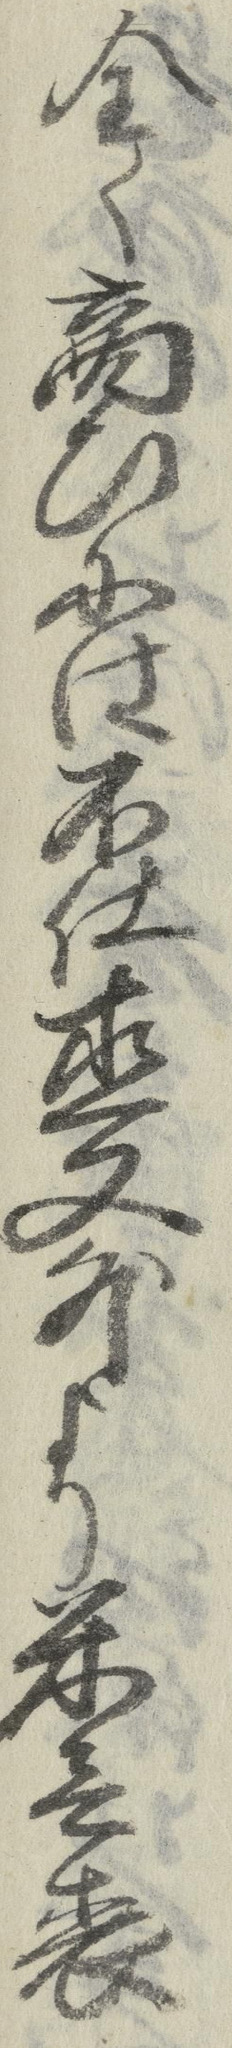全く商ひには不仕直又外より米壱表
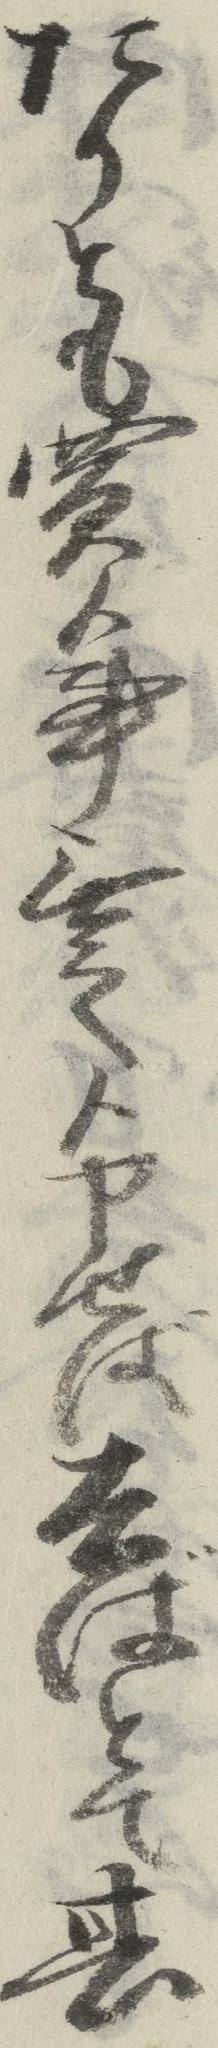たりとも買候事無之候申せばそばとて其
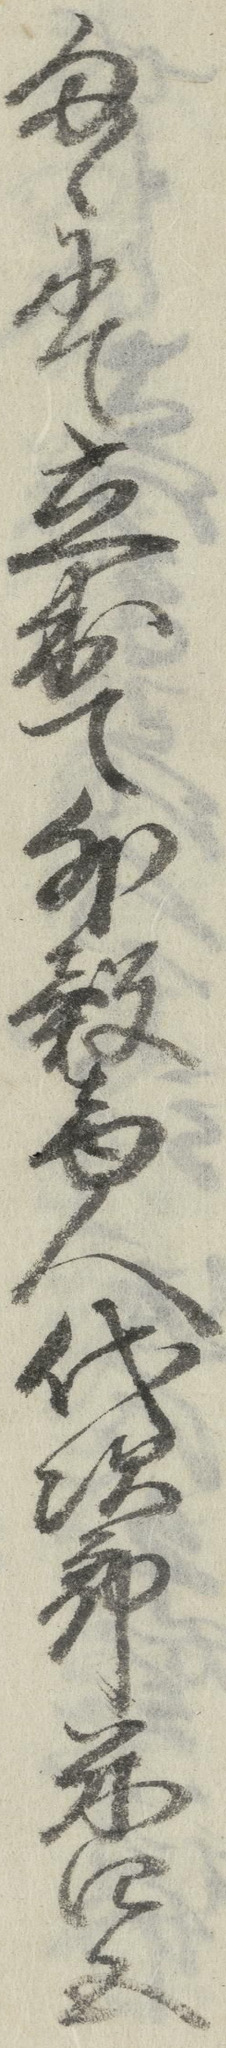まゝにて立出て外穀商人代次郎米四五
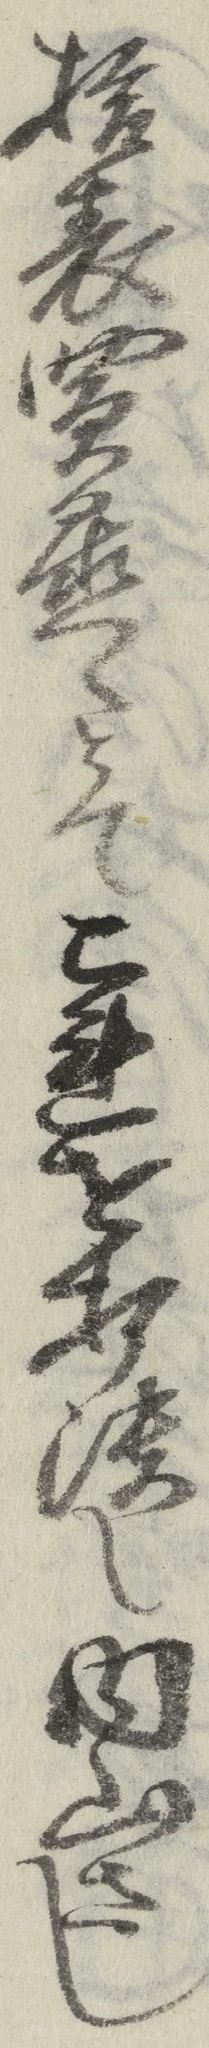拾表買置候とてこれを打潰し内山さし
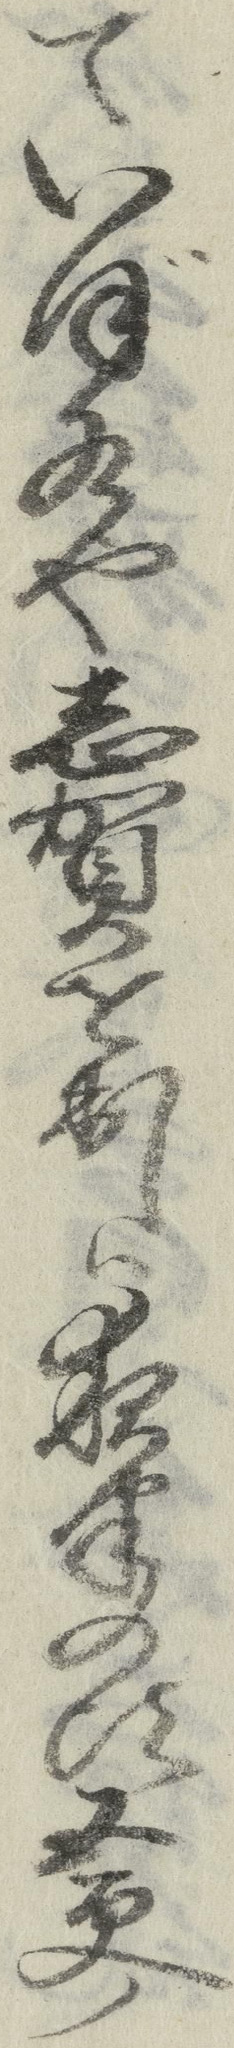ていぼ水や志賀を出しは夜半の頃五更ノ
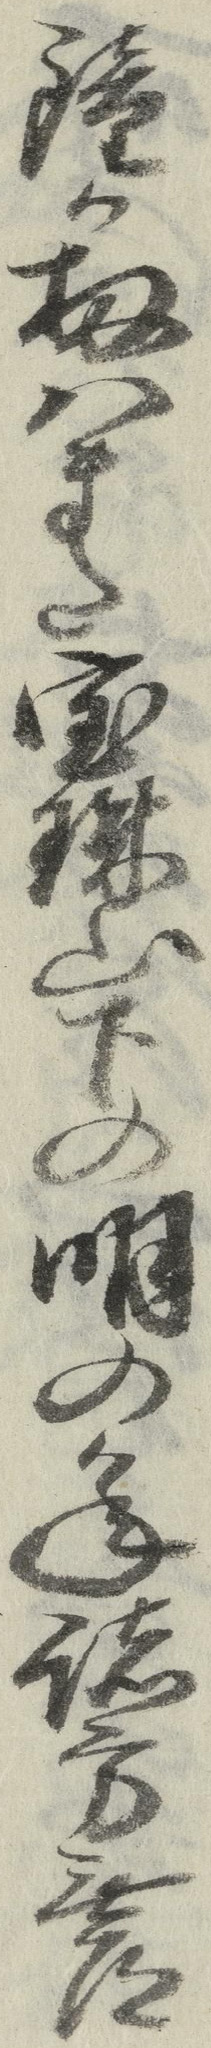鐘か扨はまた宝珠山下の明のかね諸方無道
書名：浅間大焼騒動記　中
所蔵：東京大学地震研究所図書室 Earthquake Research Institute Library, The University of Tokyo, JAPAN
